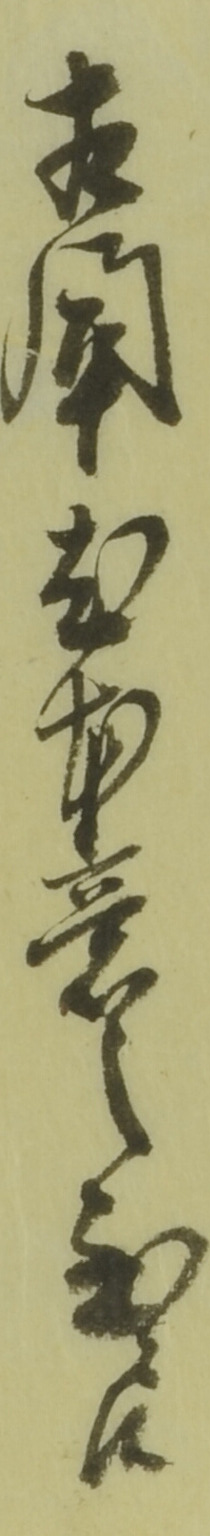相聞尤本意之至ニ候
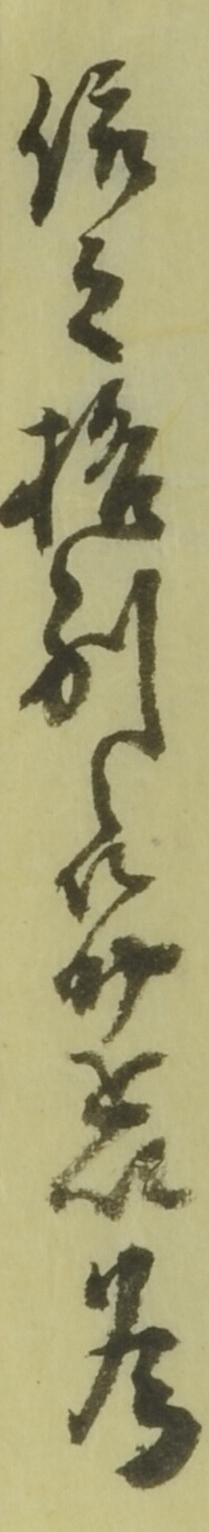依之格別之筋を以為

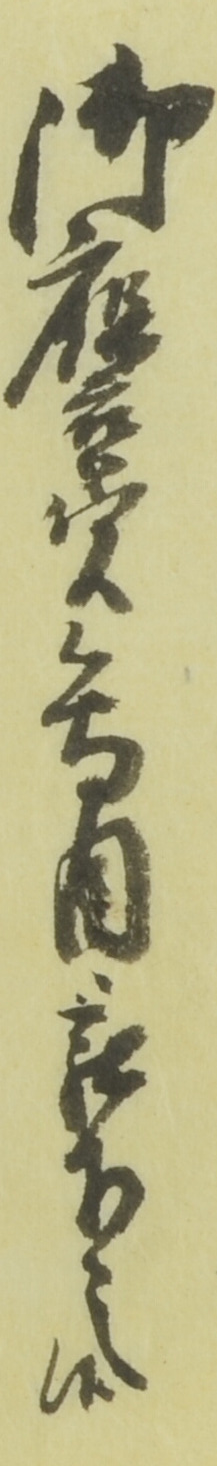御褒美鳥目被下之候
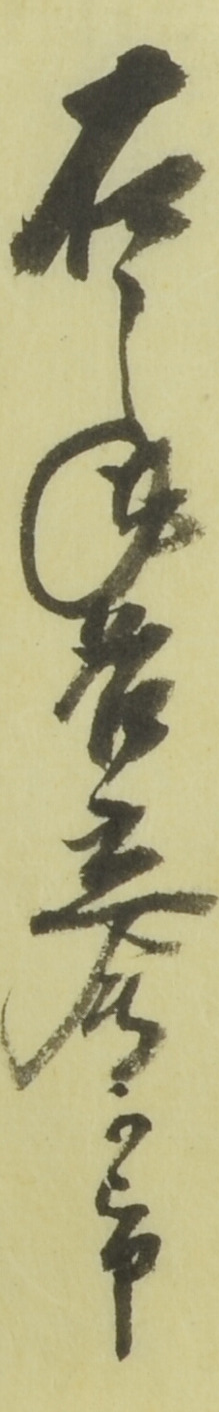右之趣各立会可被申
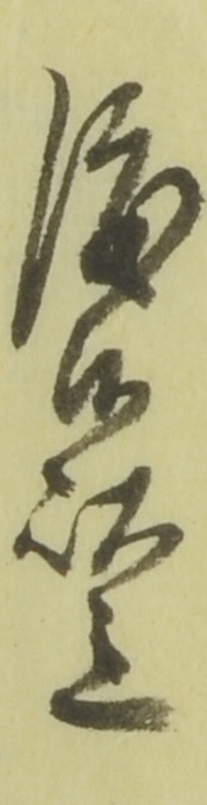渡候以上
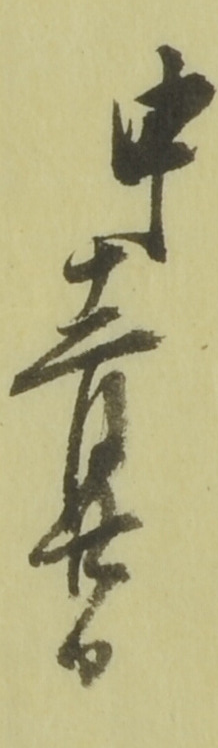申十二月廿日
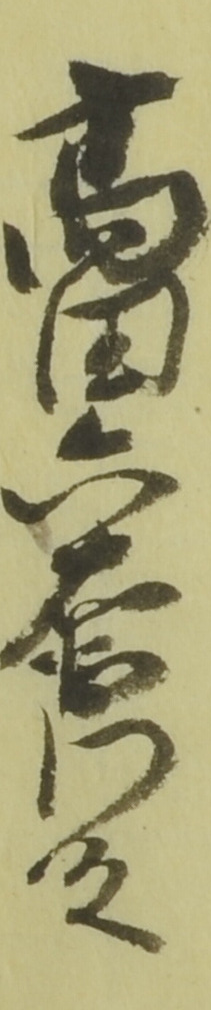高田六右衛門殿
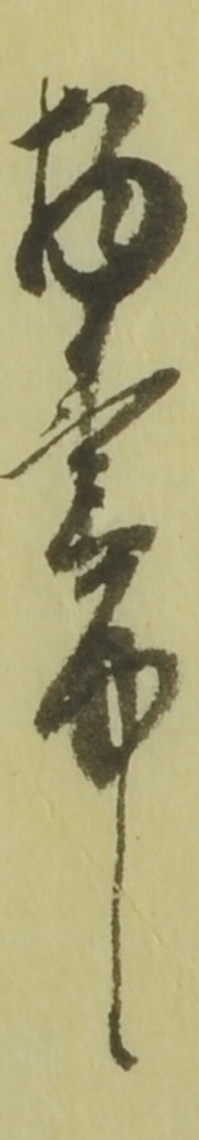物書中
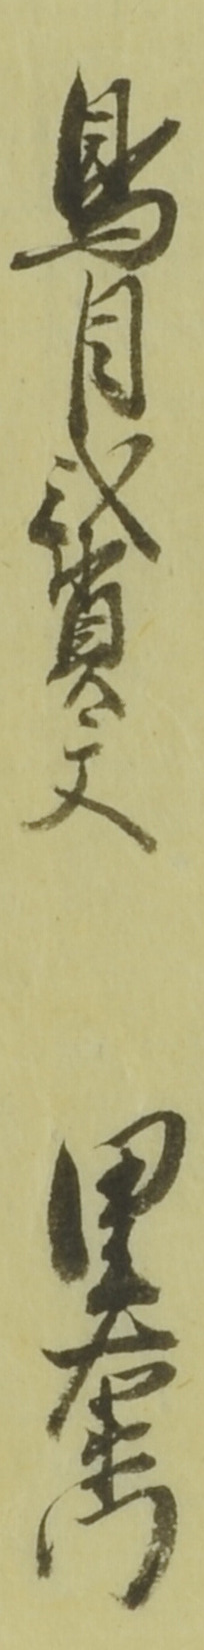鳥目弐貫文里右衛門
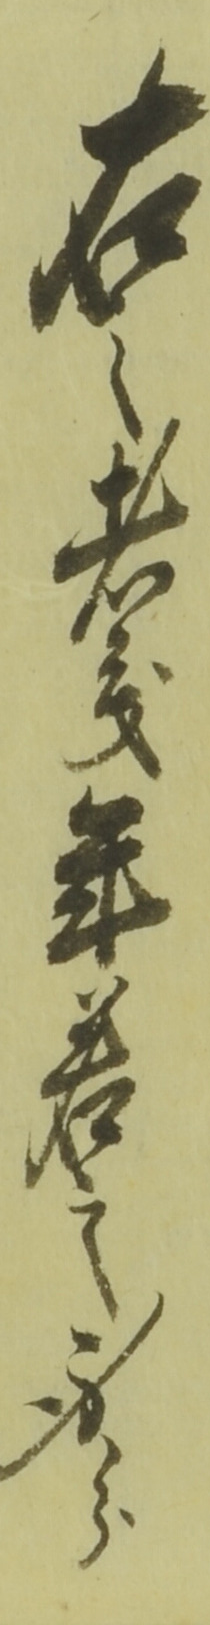右之者義年若之身分
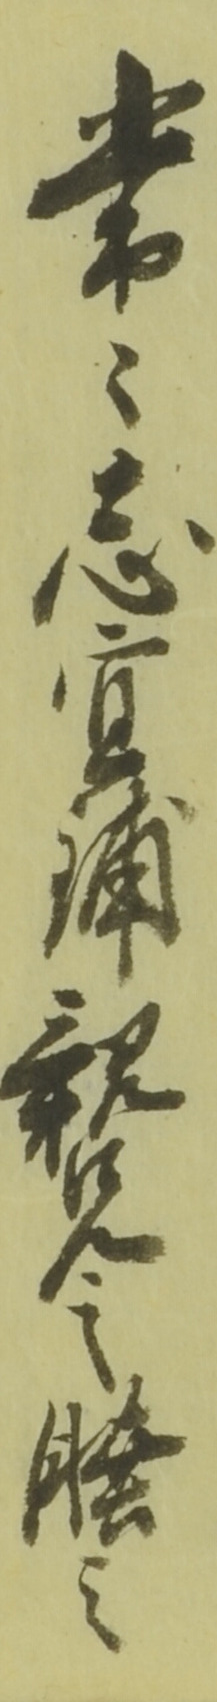常々志宜鋪親兄之睦み
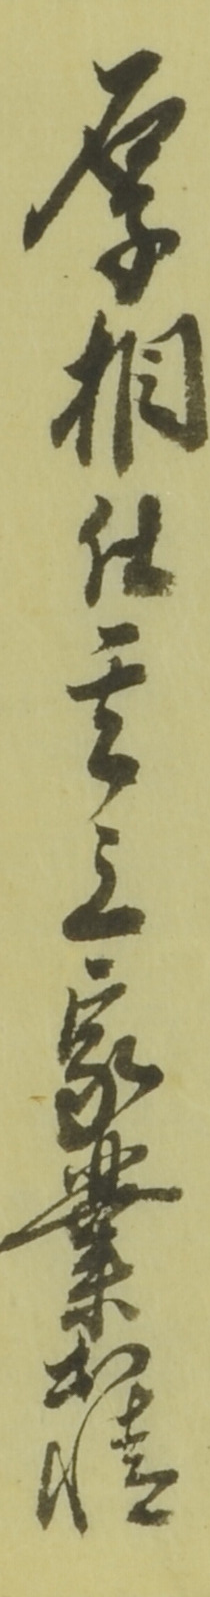厚相仕其上家業相情
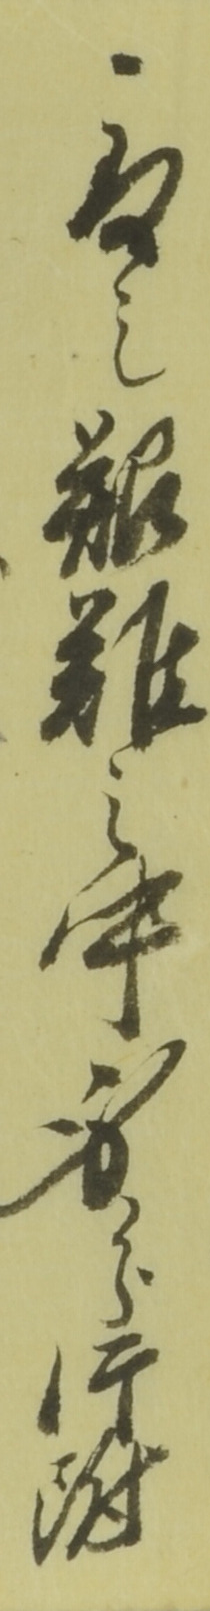致シ艱難之中身分片附
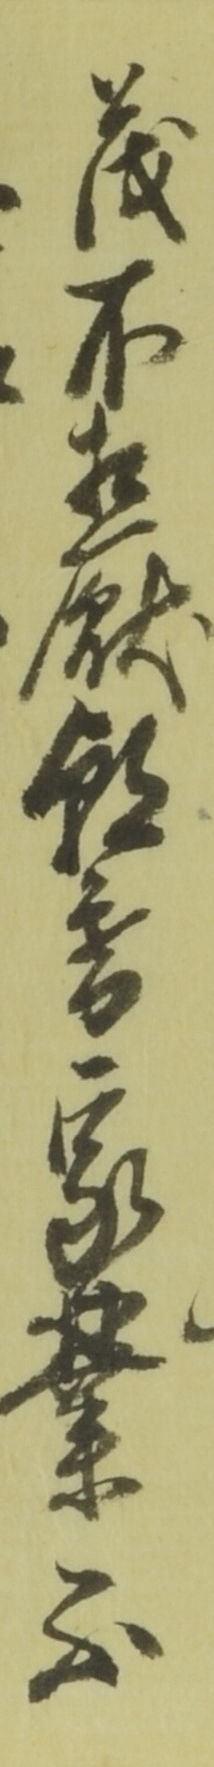も不相厭朝暮家業不
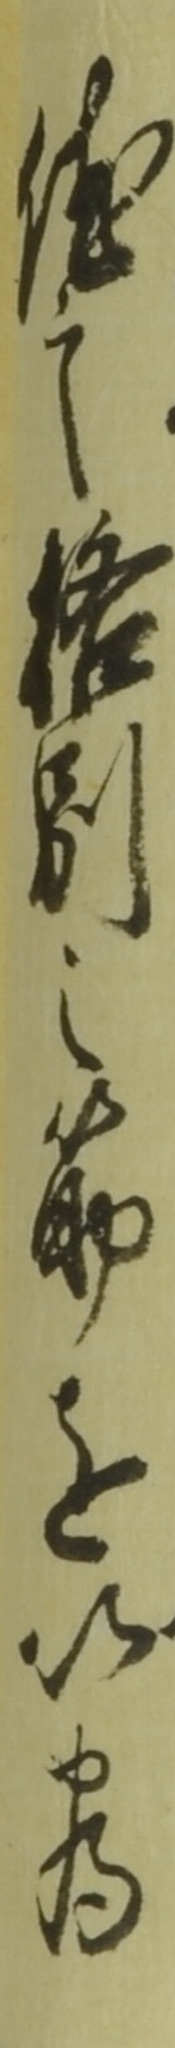依之格別之筋を以為
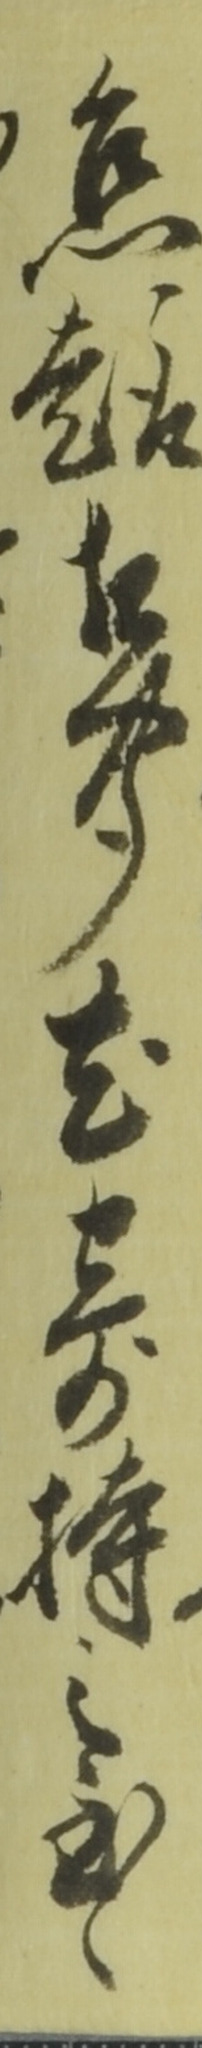怠趣相聞尤奇特之至候
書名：御触書御書附控
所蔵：伊那市立高遠町図書館・合同会社AMANE
